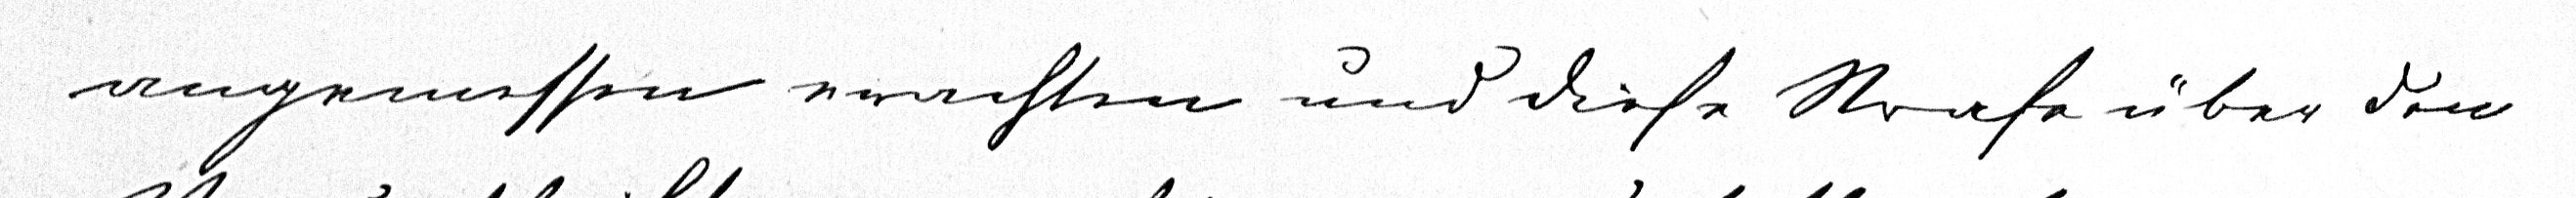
angemessen erachten und diese Strafe über den
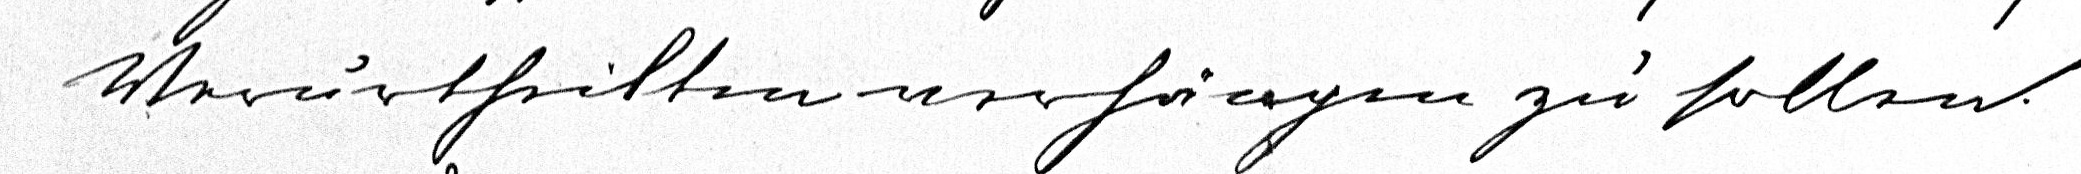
Verurtheilten verhängen zu sollen.
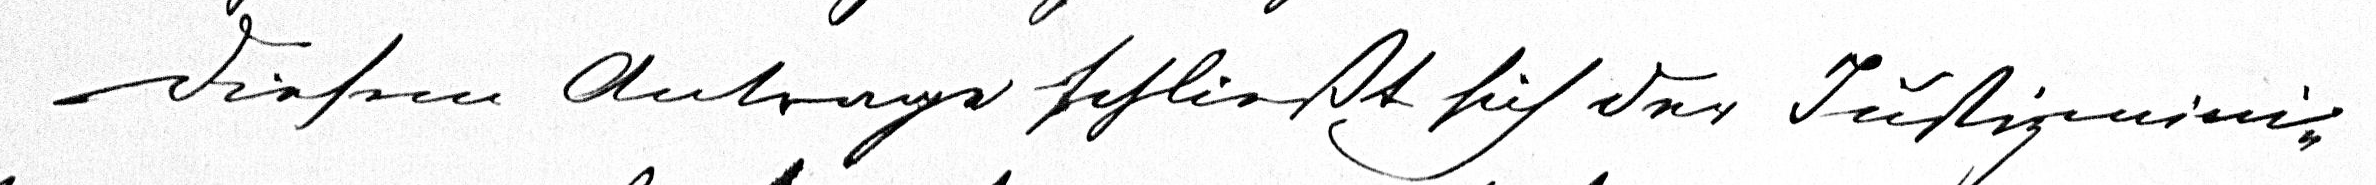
Diesem Antrage schließt sich der Justizmini¬
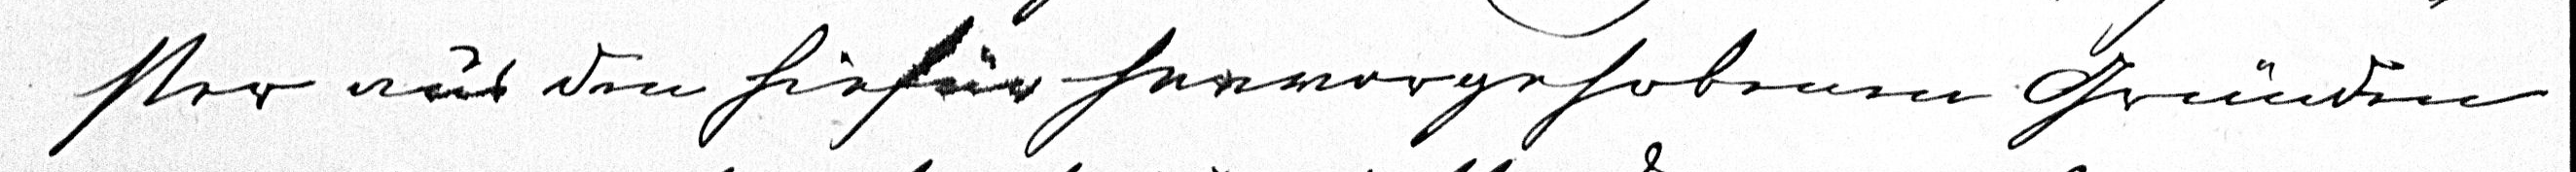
ster aus den hiefür hervorgehobenen Gründen
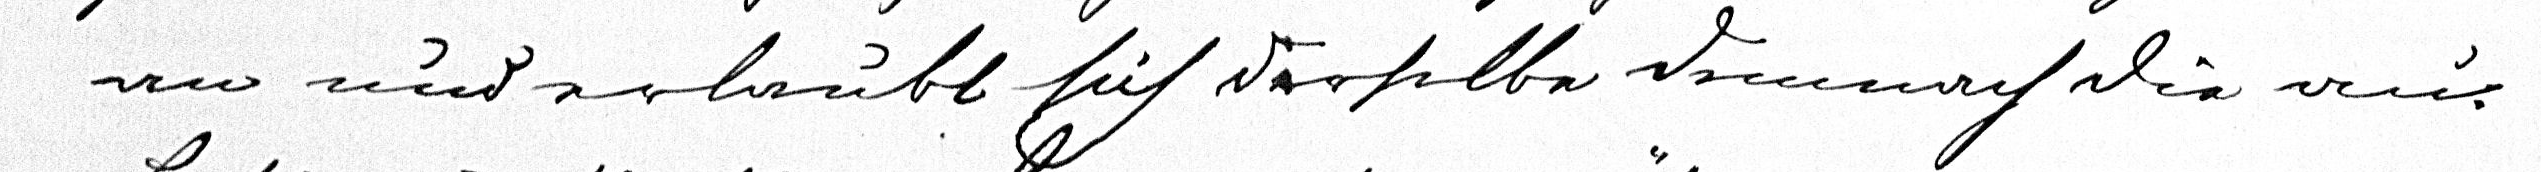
an und erlaubt Eich derselbe demnach die au.
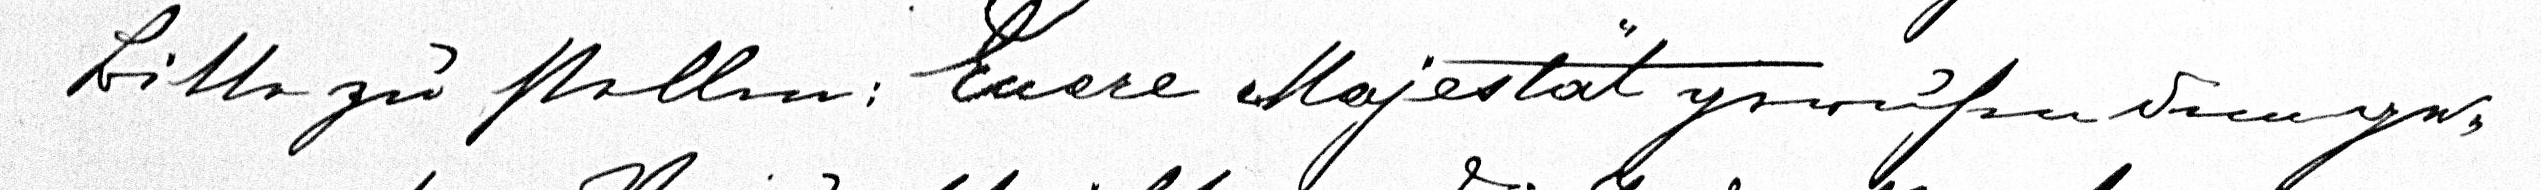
Bitte zu stellen: Euere Majestät gerufen dem ge¬
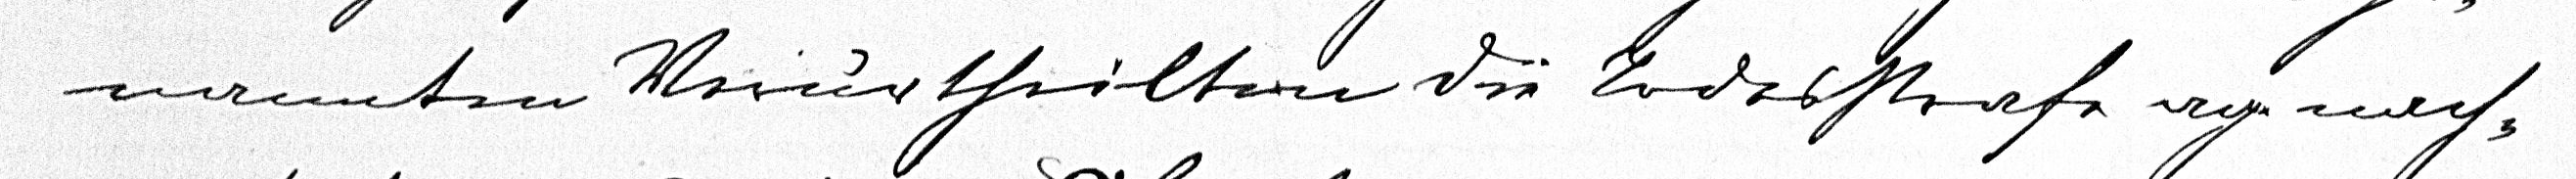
nannten Verurtheilten die Todesstrafe ag. nach¬
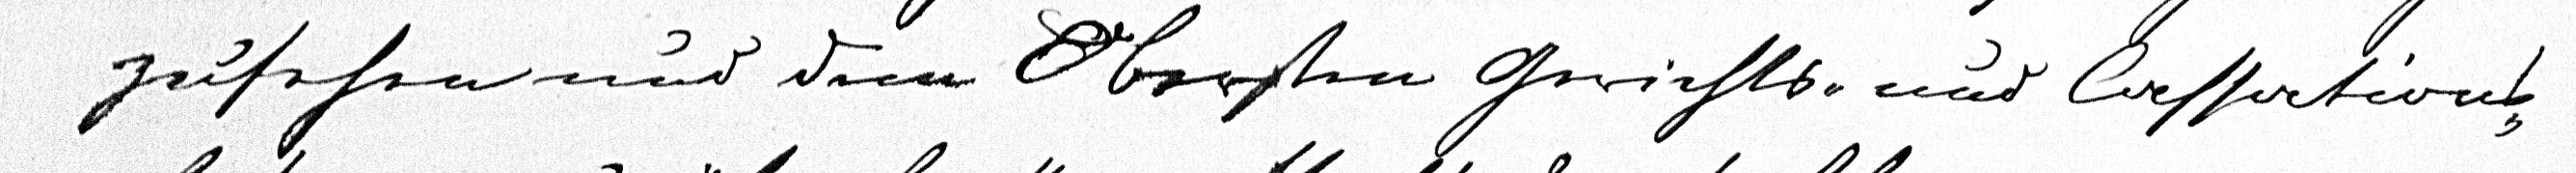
zusehen und dem Obersten Gerichts- und Cassations¬
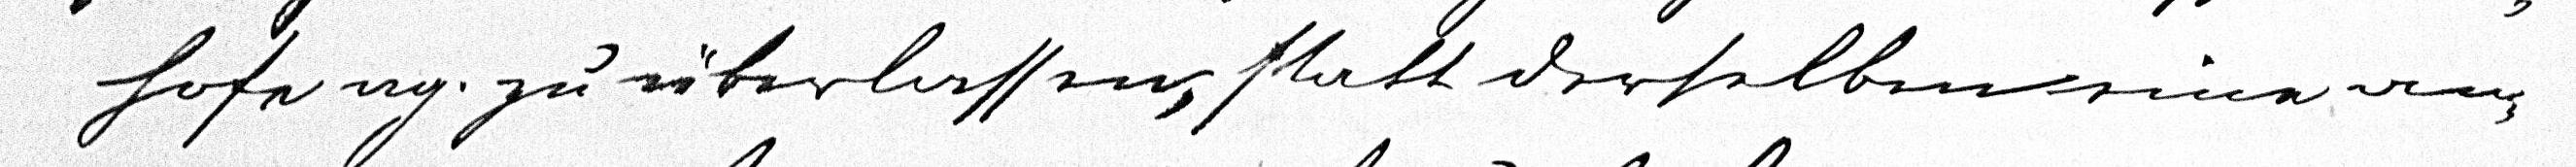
hofe zu überlassen, statt derselben eine an¬
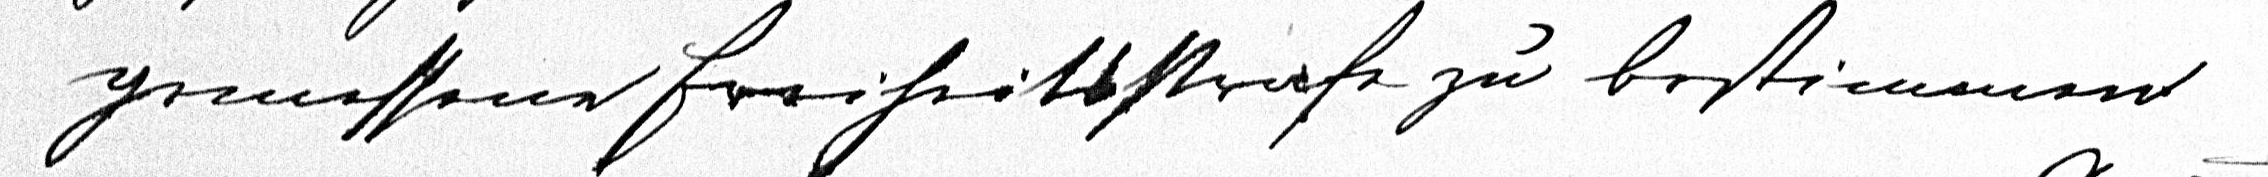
gemessene Freiheitsstrafe zu bestimmen
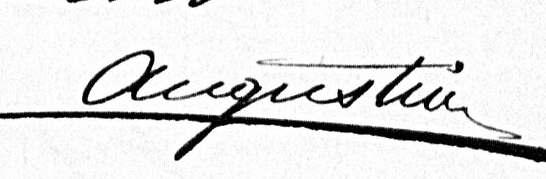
Augustin
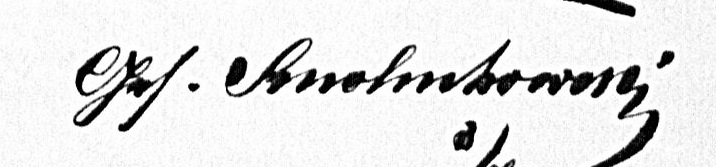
Ges. Smolxx
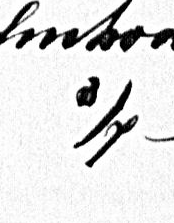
xx
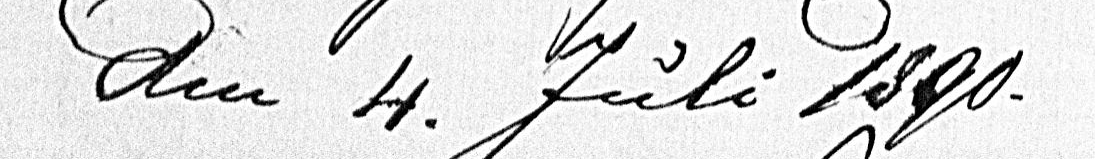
Am 4. Juli 1890.
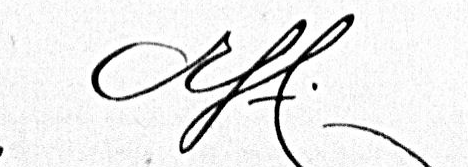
Ah E.
